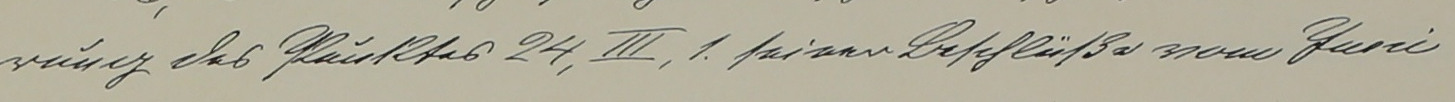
rung des Punktes 24, III.1. seiner Beschlüße vom Juni
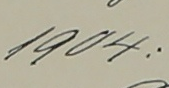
1904:
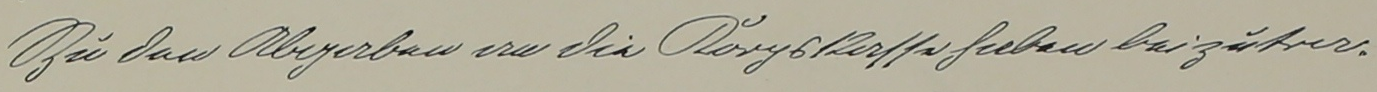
Zu den Abgaben an die Korpskasse haben beizutra-
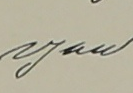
gen
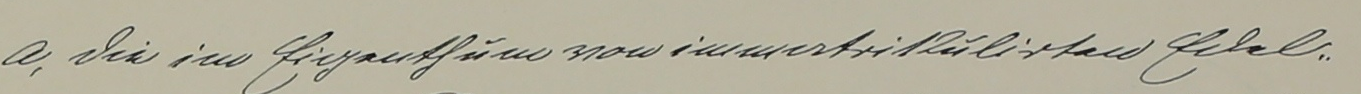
a. die im Eigenthum von immatrikulirten Edel-
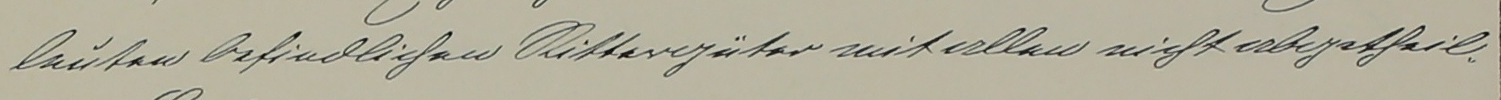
leuten befindlichen Rittergüter mit allen nicht abgetheil-
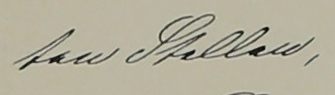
ten Stellen,
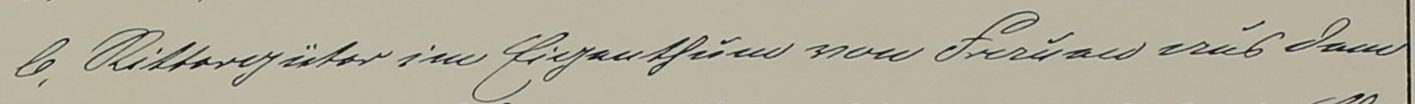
b. Rittergüter im Eigenthum von Frauen aus dem
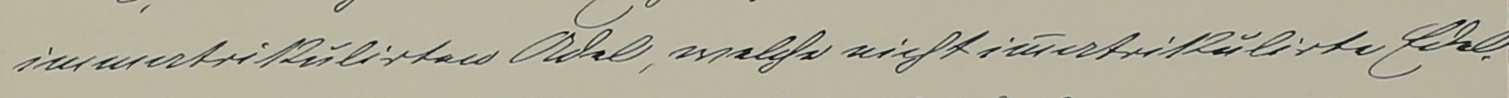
immatrikulirten Adel, welche nichtimmatrikulirte Edel-
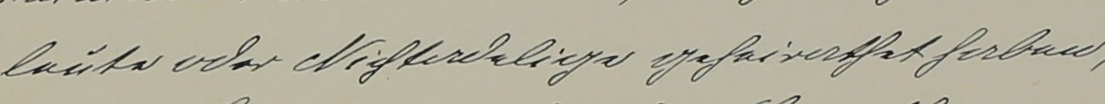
leute oder Nichtadelige geheirathet haben,
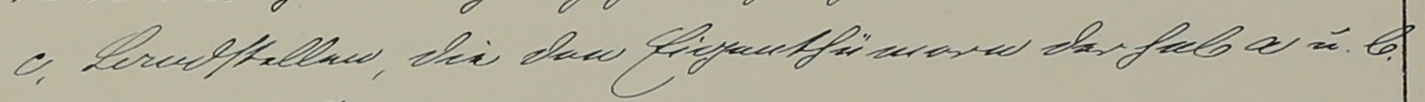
c. Landstellen, die den Eigenthümern der sub a u. b.
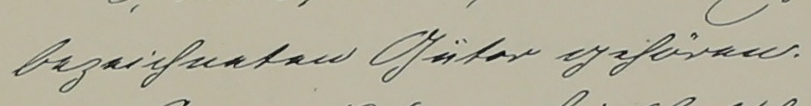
bezeichneten Güter gehören.
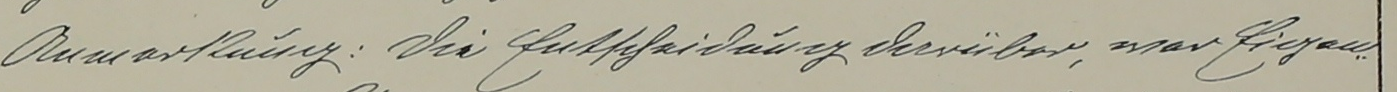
Anmerkung: Die Entscheidung darüber, wer Eigen-
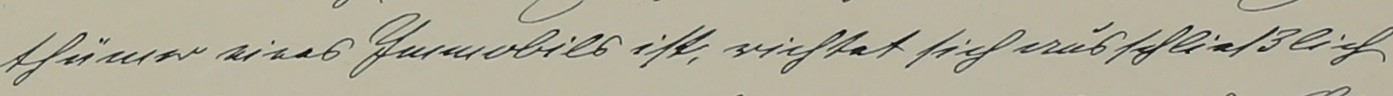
thümer eines Immobils ist, richtet sich ausschließlich
